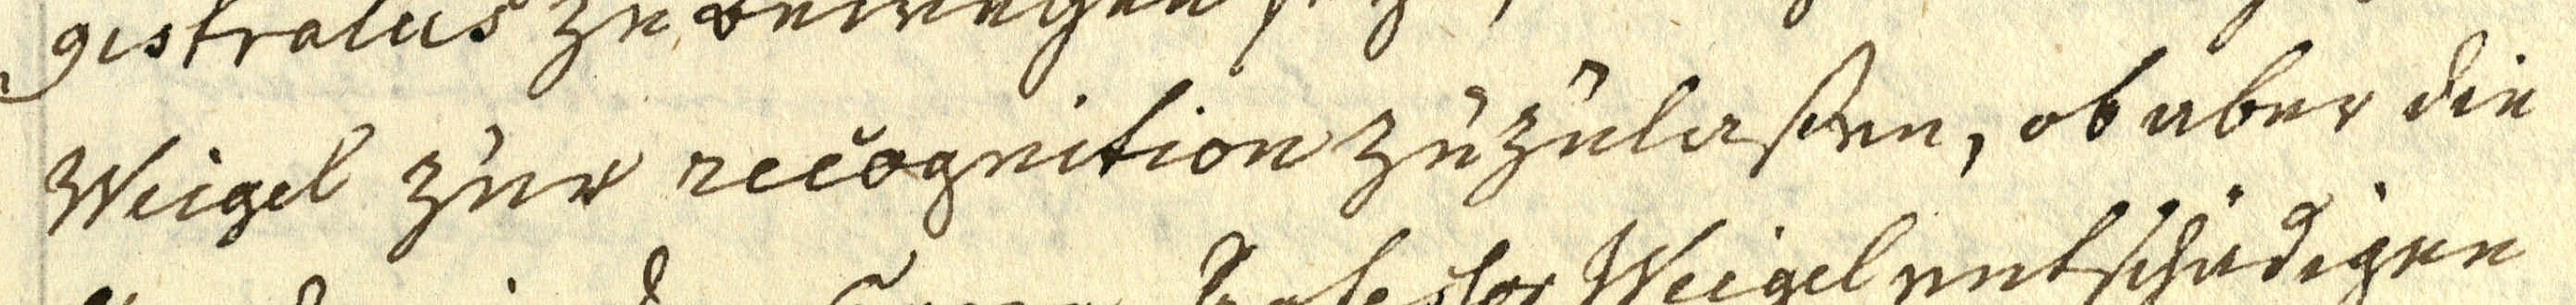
Weigel zur recognition zu zulaßen, ob aber die
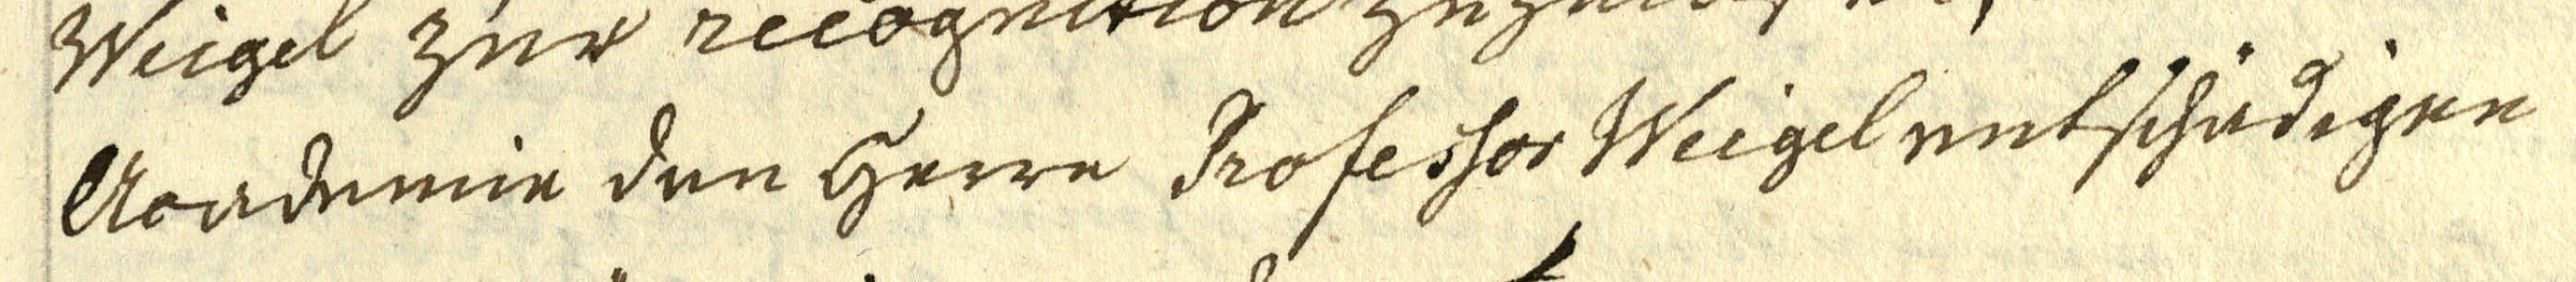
Academie den Herrn Professor Weigel entschädigen
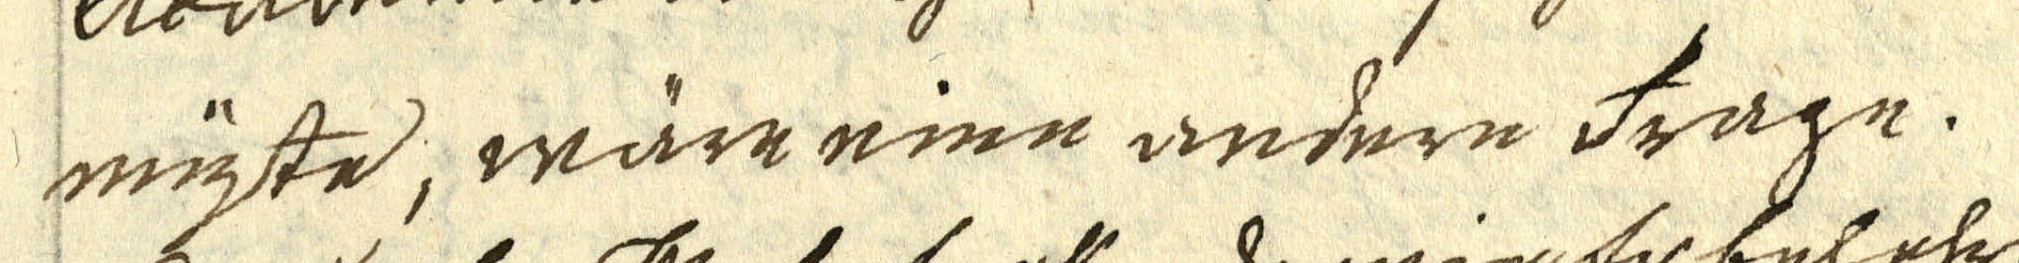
müste, wäre eine andere Frage.
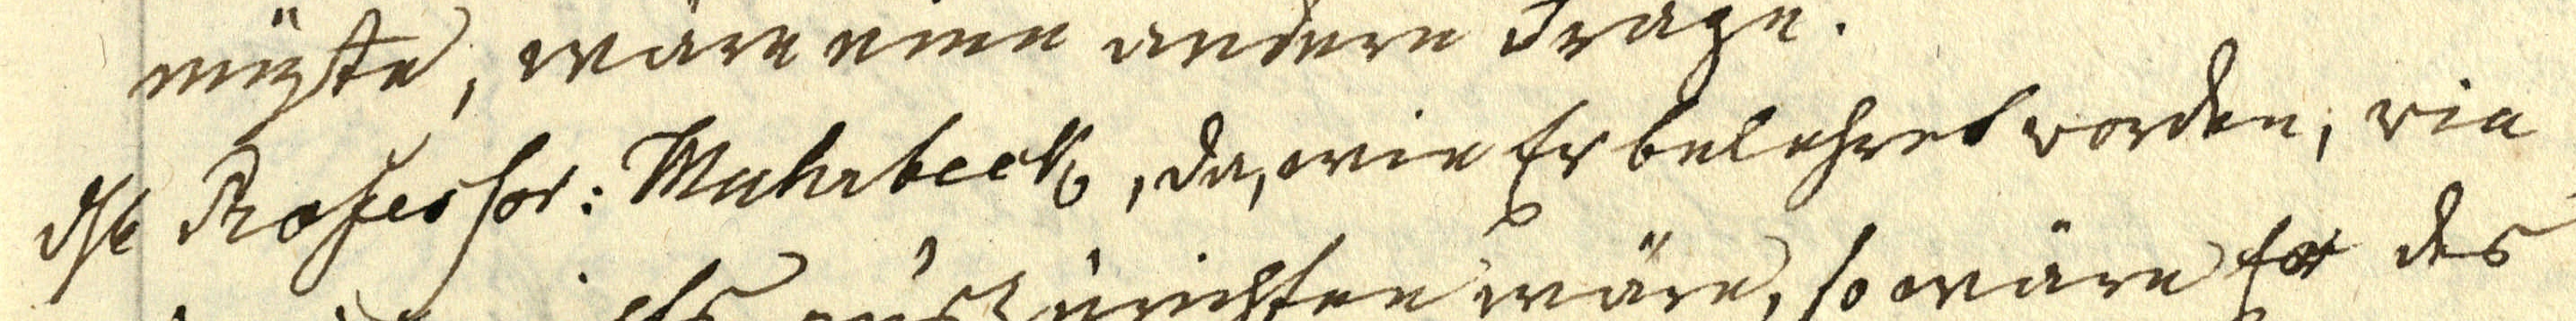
dh. Professor. Muhrbeck, Da wie Er belehret worden, via
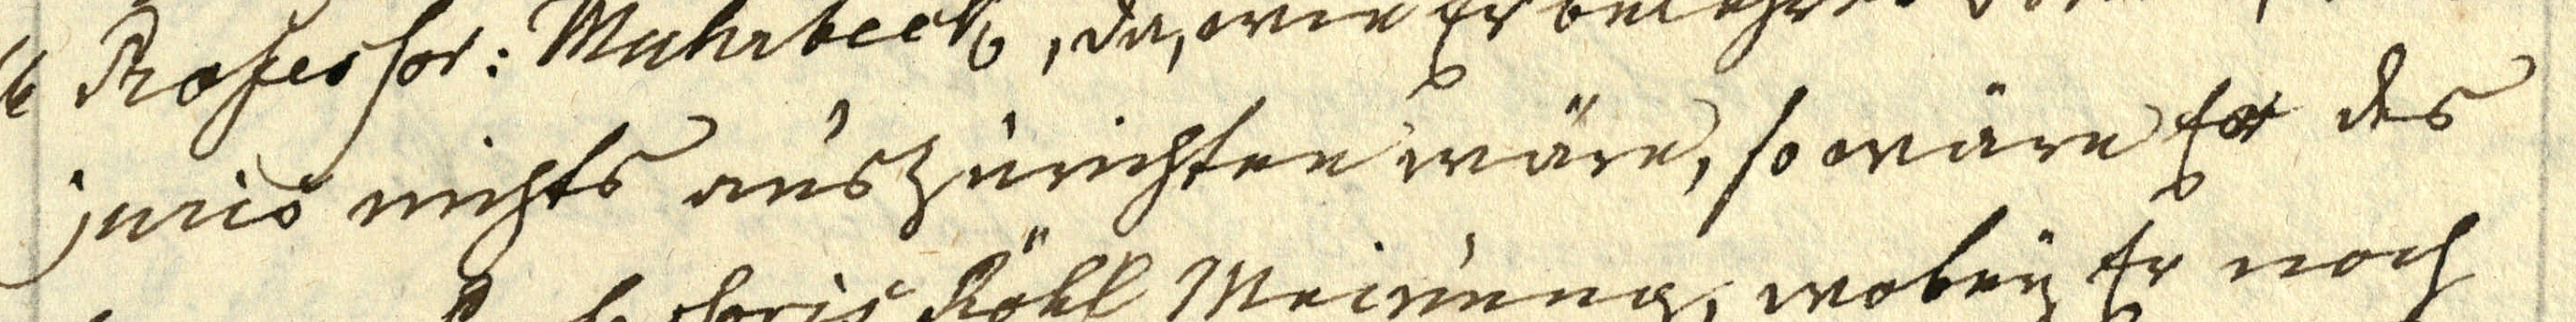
juris nichts auszurichten wäre, so wäre Er des
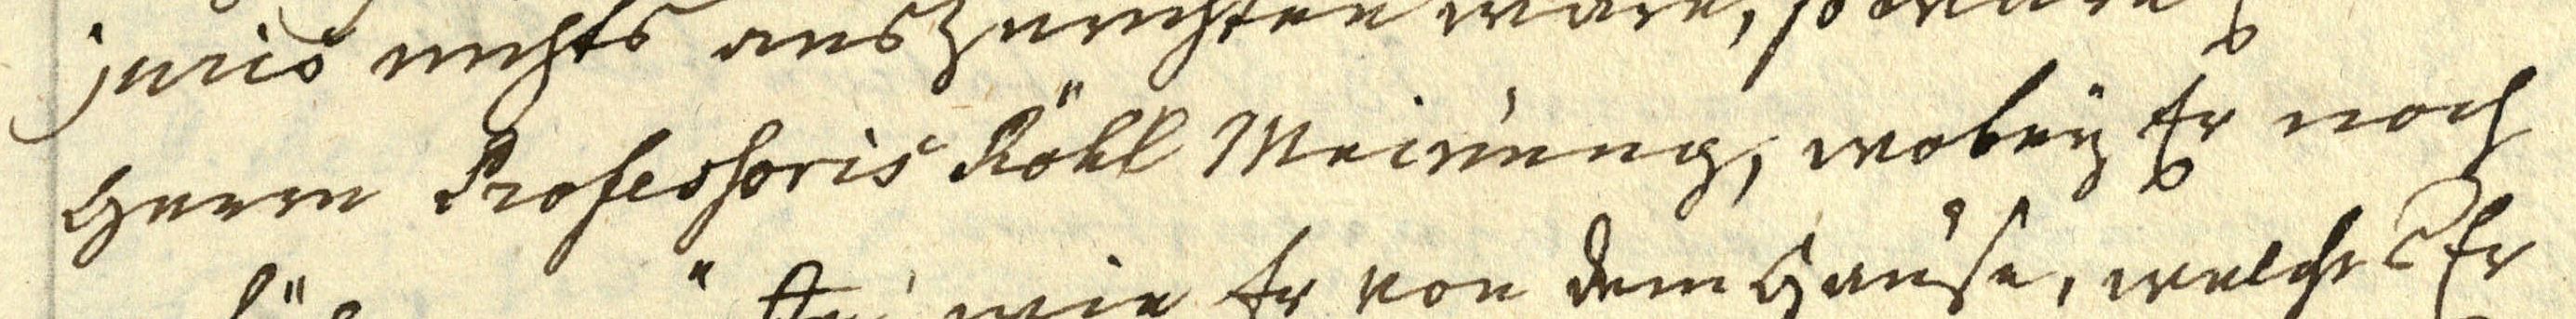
Herrn Professoris Röhl Meinung wobeÿ Er noch
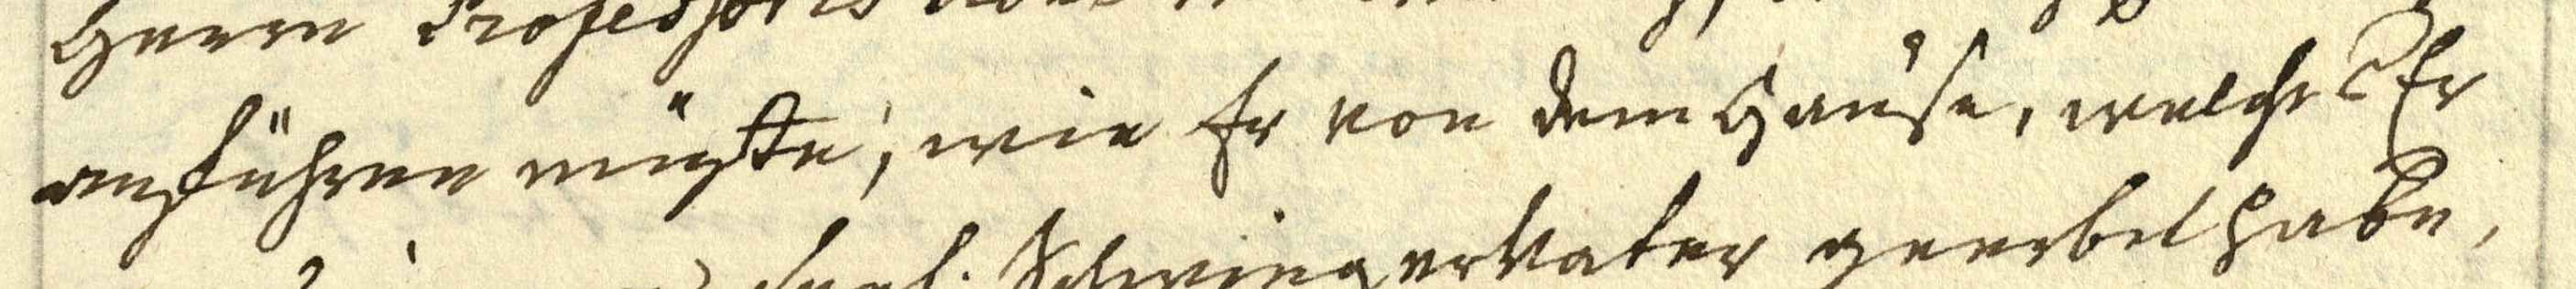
anführen müste, wie Er von dem Hause, welches Er
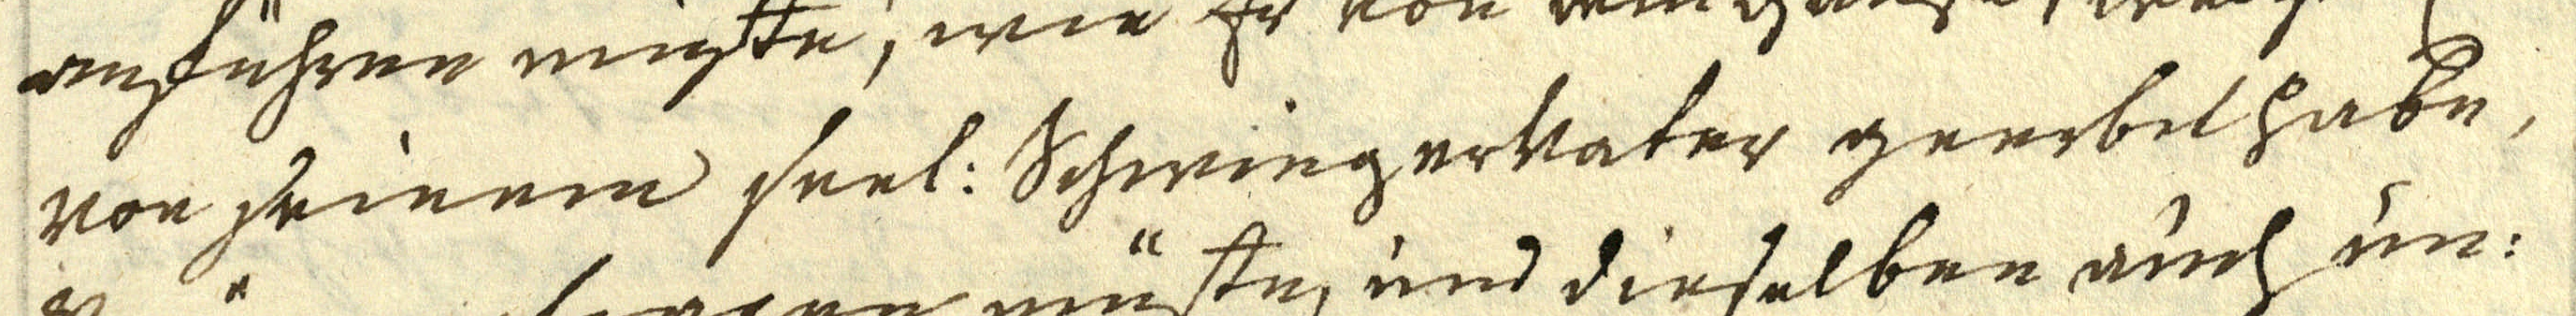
von seinem seel. Schwiegervater geerbet habe,
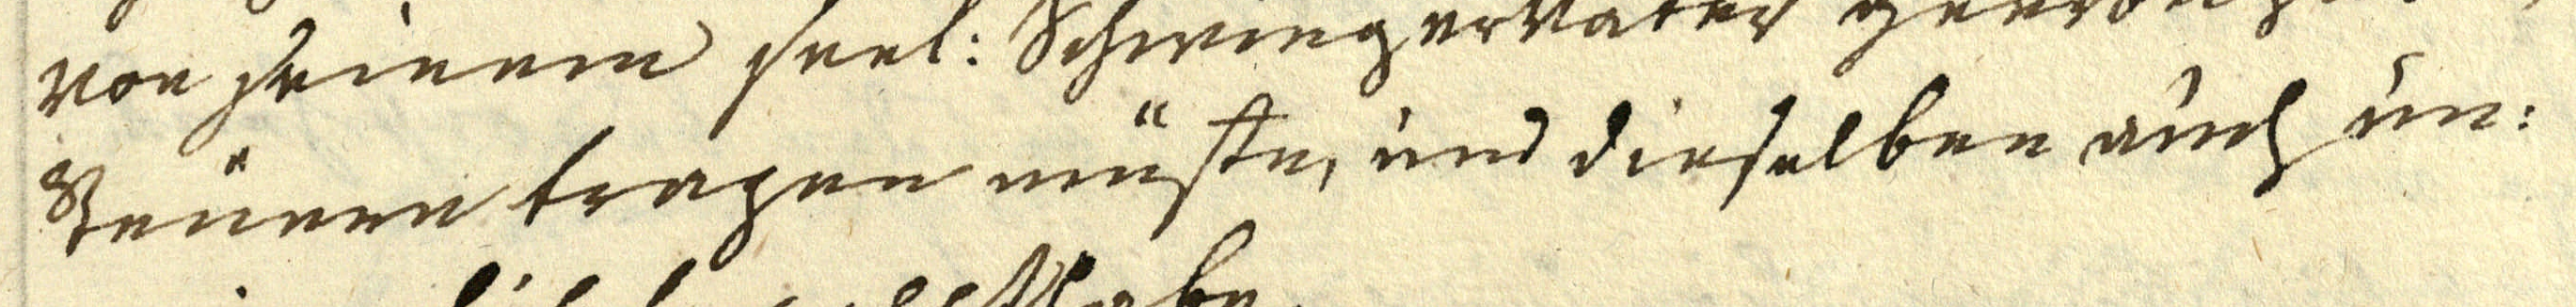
Steuern tragen müste, und dieselben auch un¬
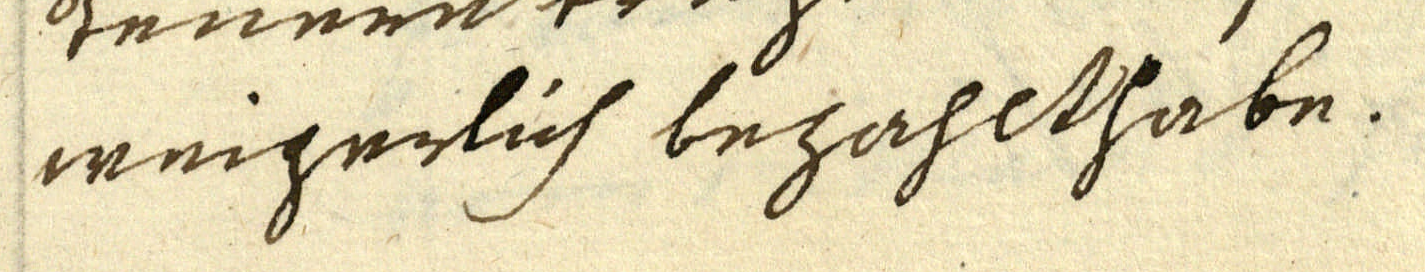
weigerlich bezahlt habe.
